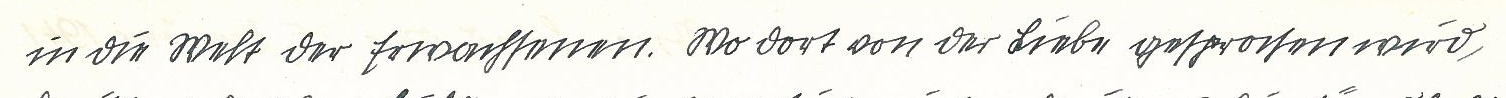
in die Welt der Erwachsenen. Wo dort von der Liebe gesprochen wird,
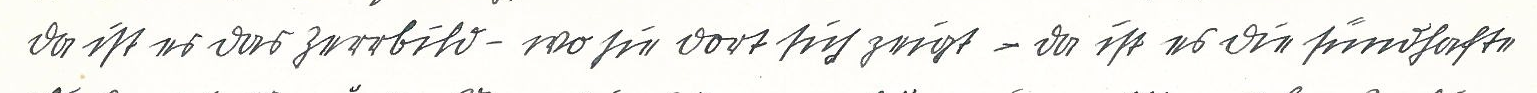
da ist es das Zerrbild – wo sie dort sich zeigt – da ist es die sündhafte
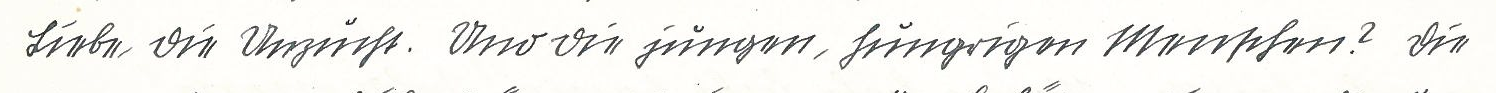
Liebe, die Unzucht. Und die jungen, hungrigen Menschen? Die
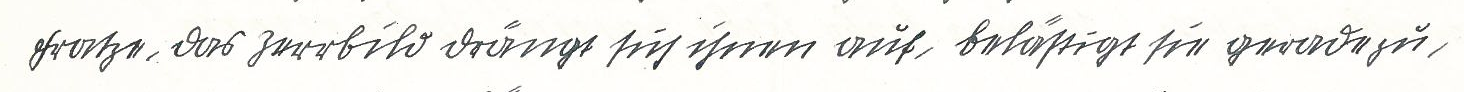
Fratze, das Zerrbild drängt sich ihnen auf, belästigt sie gerade zu,
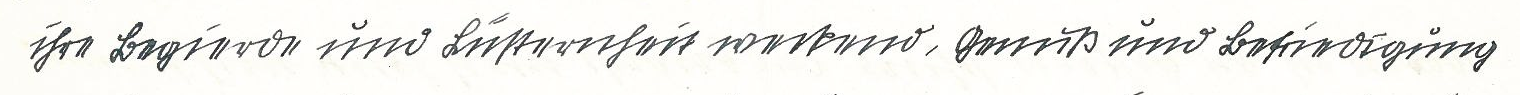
ihre Begierde und Lüsternheit weckend, Genuß und Befriedigung
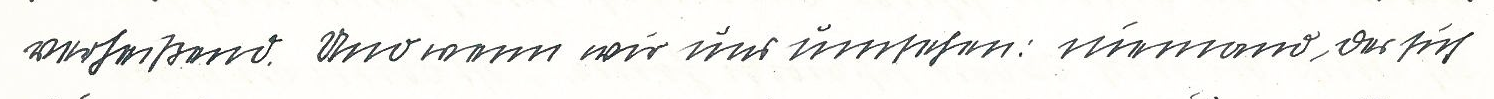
verheißend. Und wenn wir uns umsehen: niemand, der sich
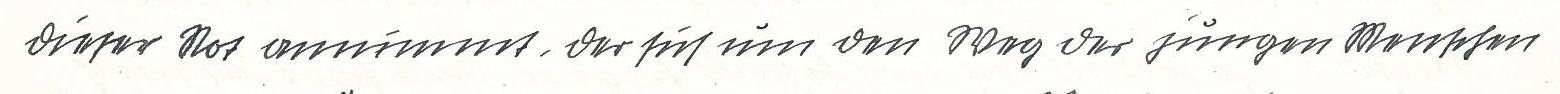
dieser Not annimmt, der sich um den Weg der jungen Menschen
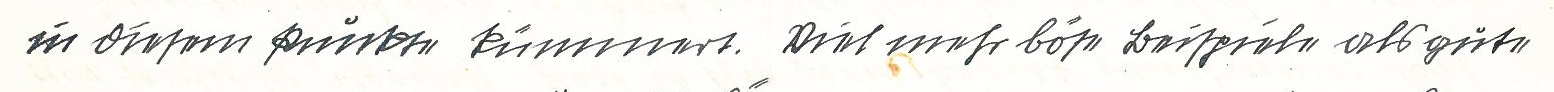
in diesem Punkte kümmert. Viel mehr böse Beispiele als gute
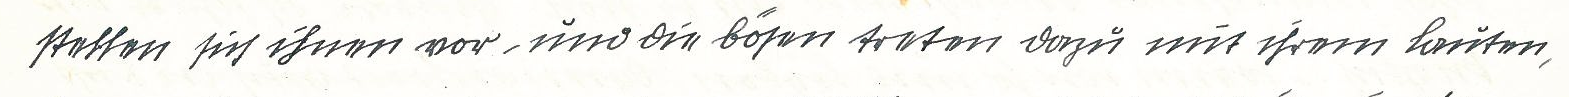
stellen sich ihnen vor, und die bösen treten dazu mit ihrem lauten,
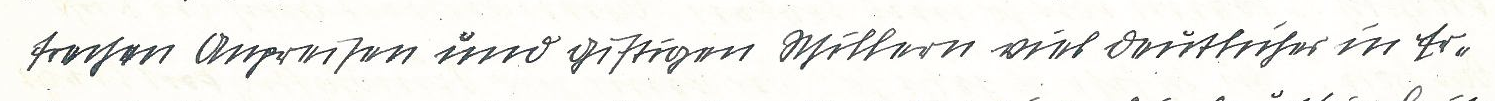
frechen Ansprechen und giftigen Schillern viel deutlicher in Er¬
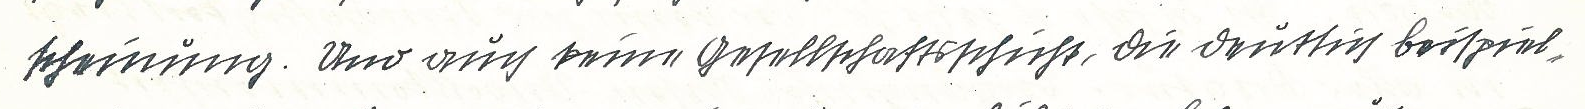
scheinung. Und auch keine Gesellschaftsschicht, die deutlich beispiel¬
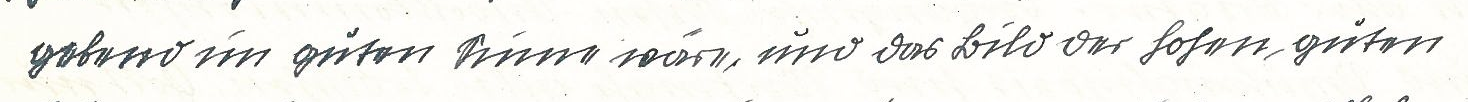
gebend im guten Sinne wäre, und das Bild der hohen, guten
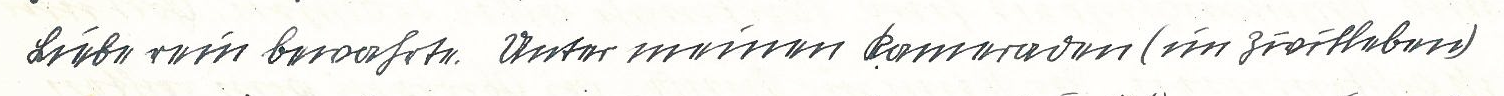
Liebe rein bewahrte. Unter meinen Kameraden (im Zivilleben)
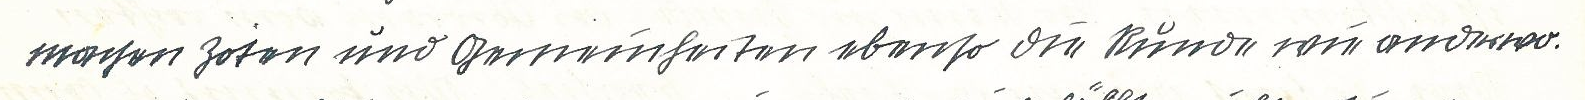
machen Zoten und Gemeinheiten ebenso die Runde wie anderswo.
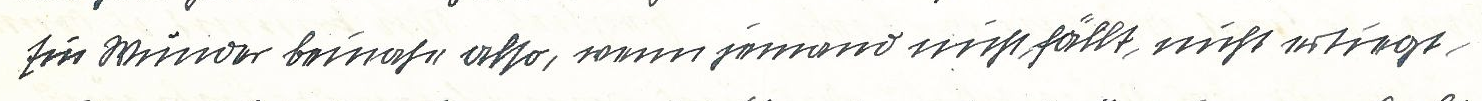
Ein Wunder beinahe also, wenn jemand nicht fällt, nicht erliegt,
